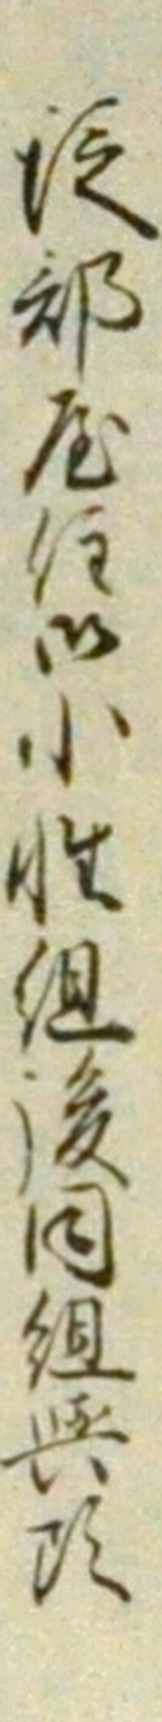従部屋住御小姓組後同組與頭
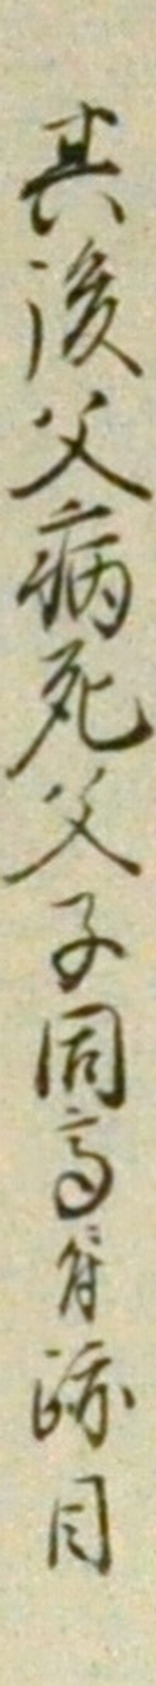其後父病死父子同高ニ付跡目
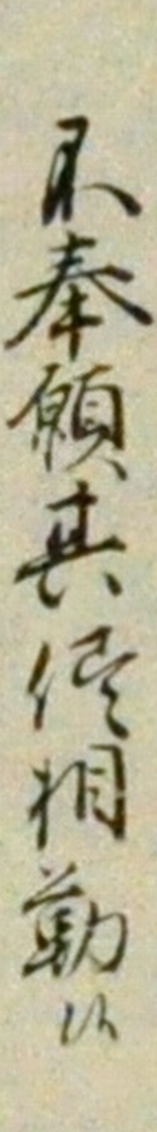不奉願其侭相勤候
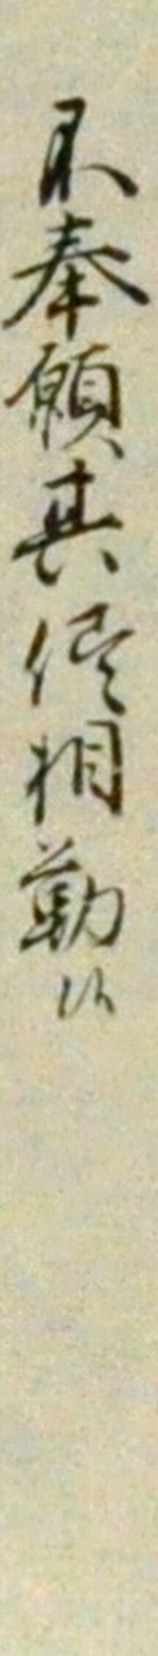不奉願其侭相勤候
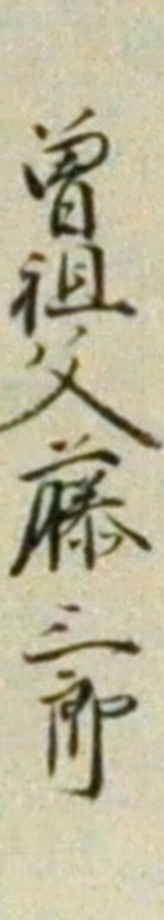曽祖父藤三郎
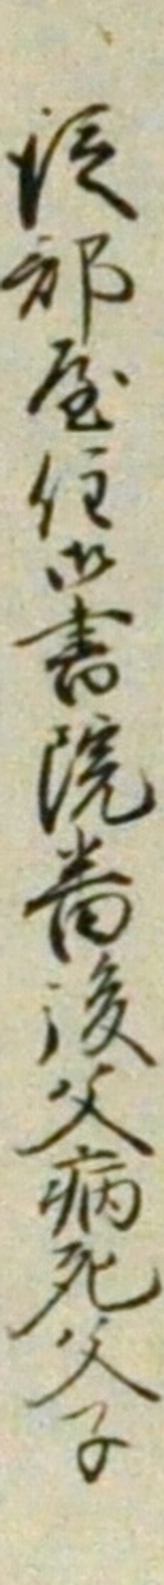従部屋住御書院番後父病死父子
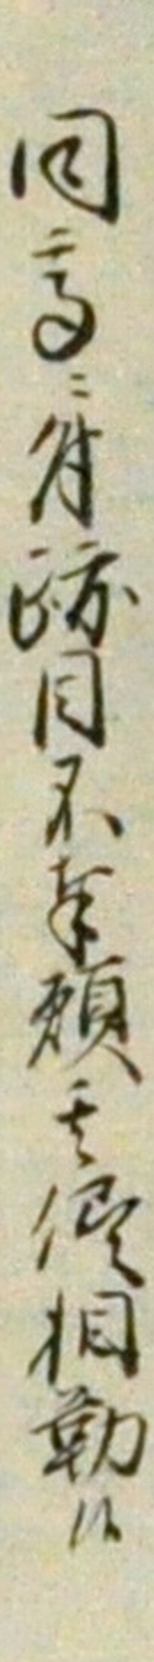同高ニ付跡目不奉願其侭相勤候
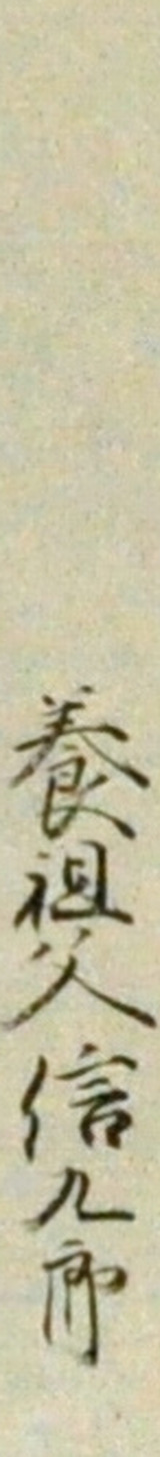養祖父信九郎
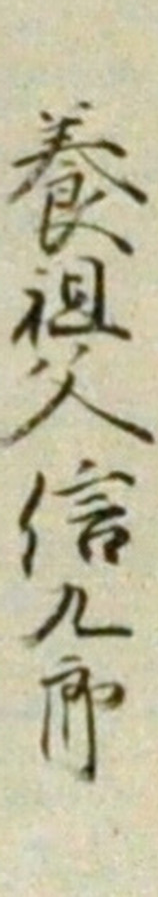養祖父信九郎
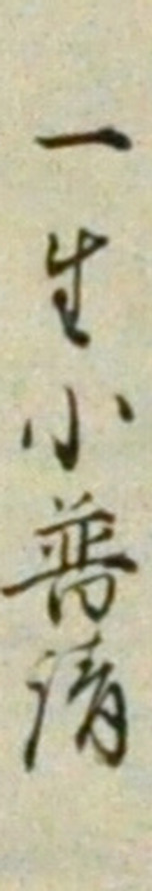一生小普請
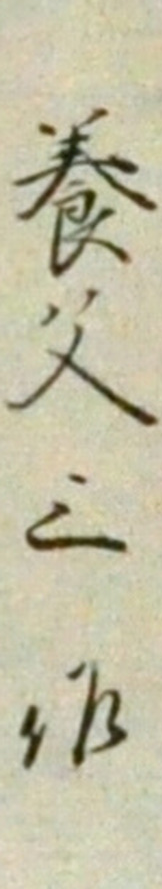養父三作
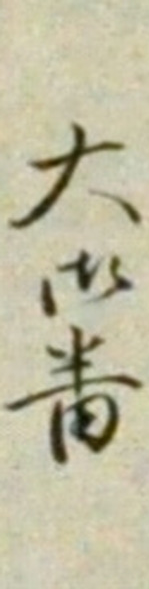大御番
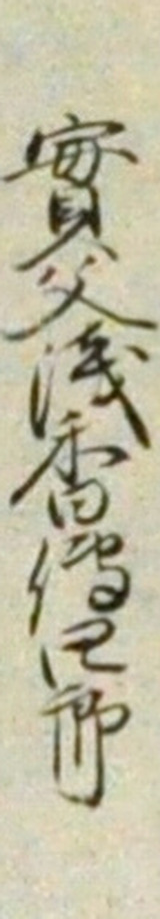実父浅香傳四郎
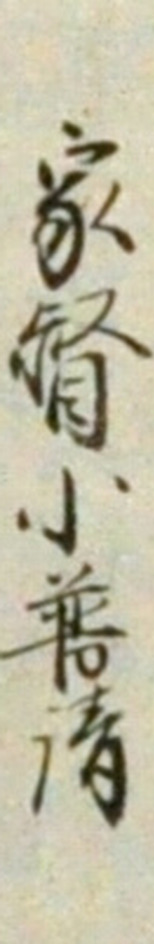家督小普請
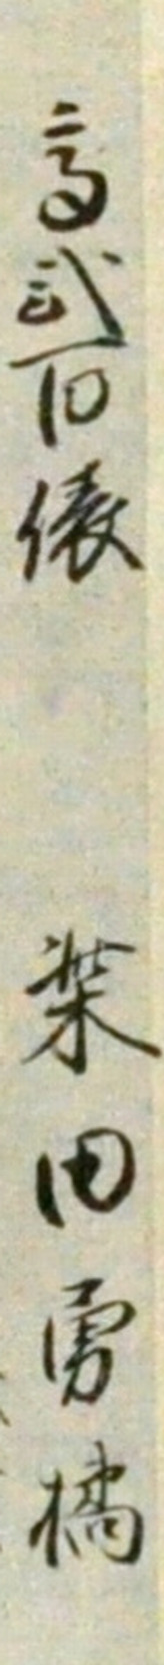高弐百俵柴田勇橘
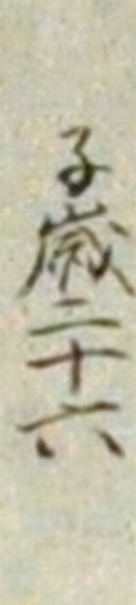子歳二十六
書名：若年寄御役中御調書付
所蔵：伊那市立高遠町図書館・合同会社AMANE
